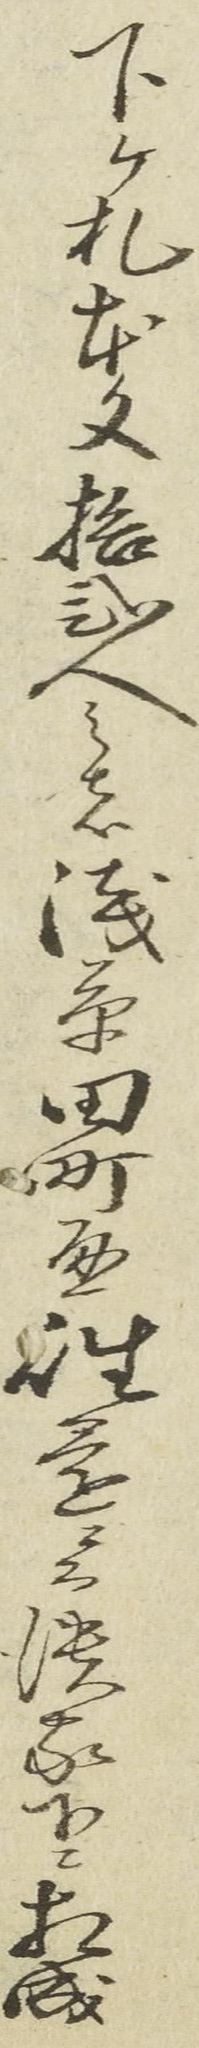下ケ札本文拾弐人之者浅草田町通往還ニ而潰家下ニ相成
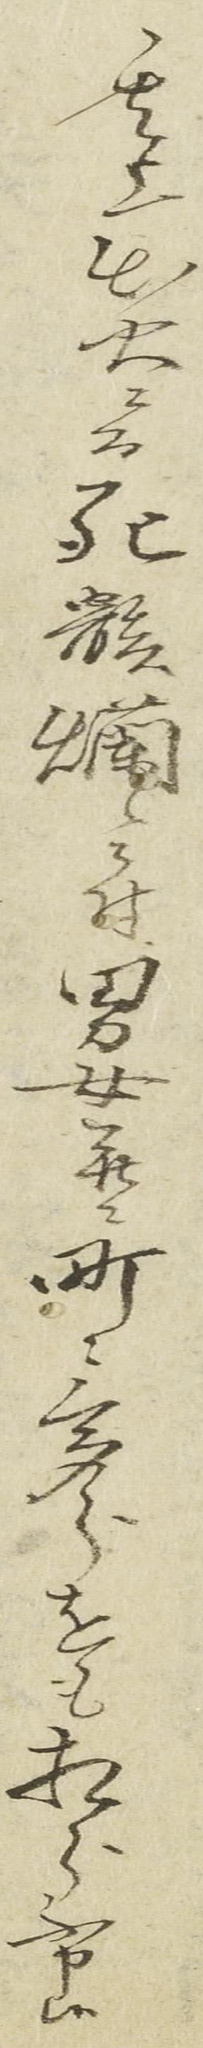其の上出火ニ而死骸爛候ニ付男女幷ニ町々多分をも相分不申候
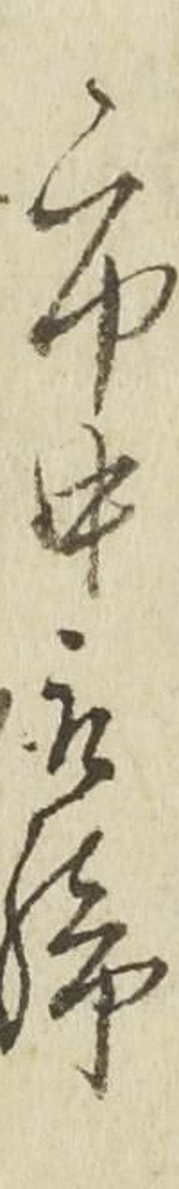市中取締
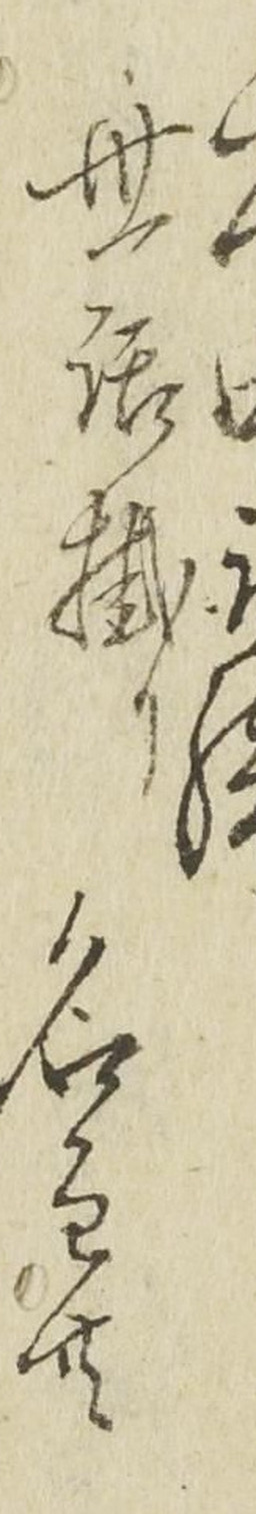世話掛り名主共
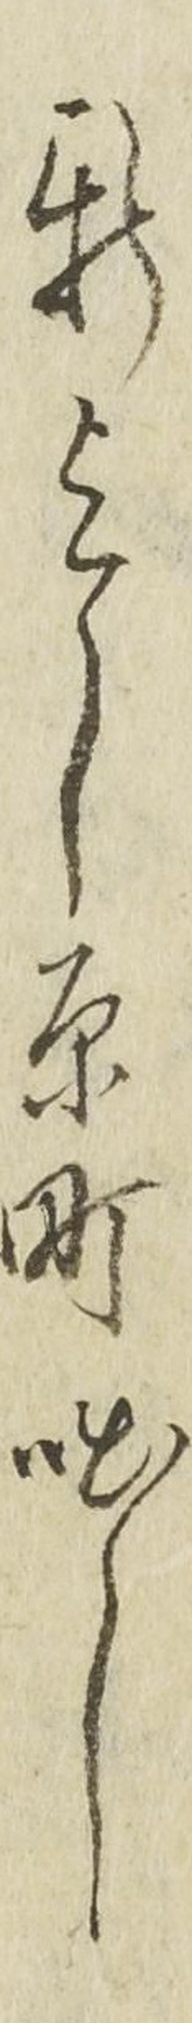新よし原町咄し
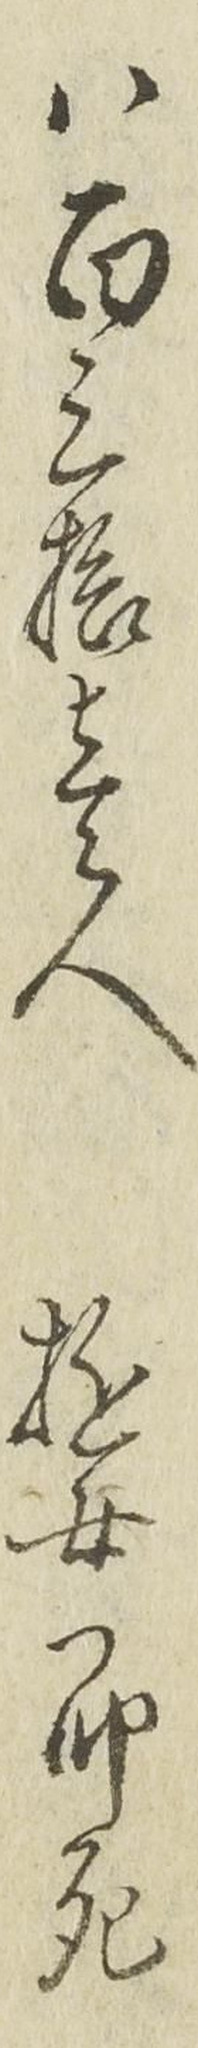八百三拾壱人遊女届死
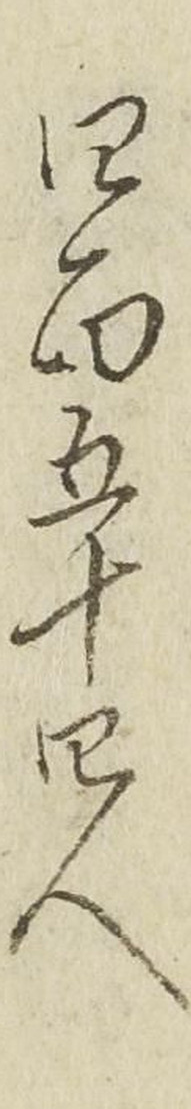四百五十四人
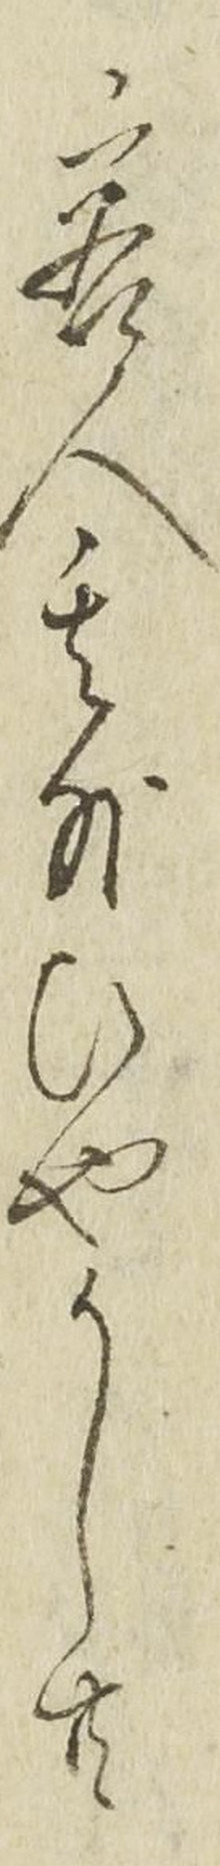客人其外ひやかし共
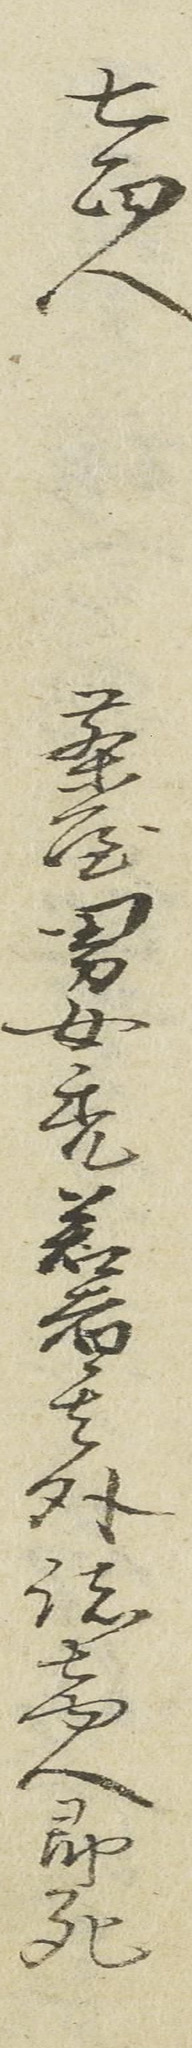七百人茶屋男女禿若者其外諸商人即死
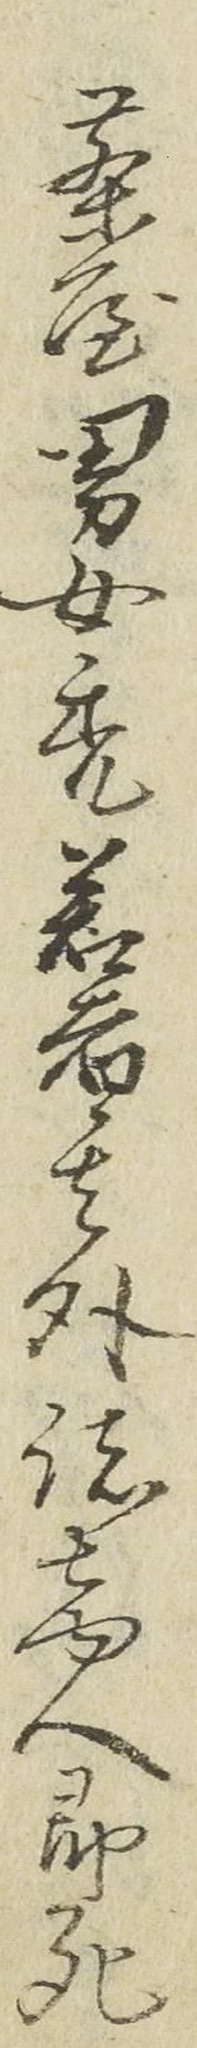七百人茶屋男女禿若者其外諸商人即死
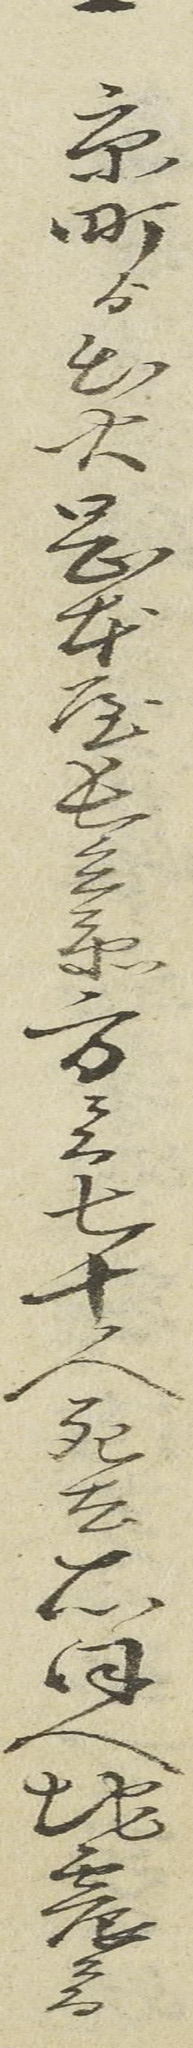一京町ゟ出火岡本屋長兵衛方ニ而七十人死去ハ右同人地震ニ而
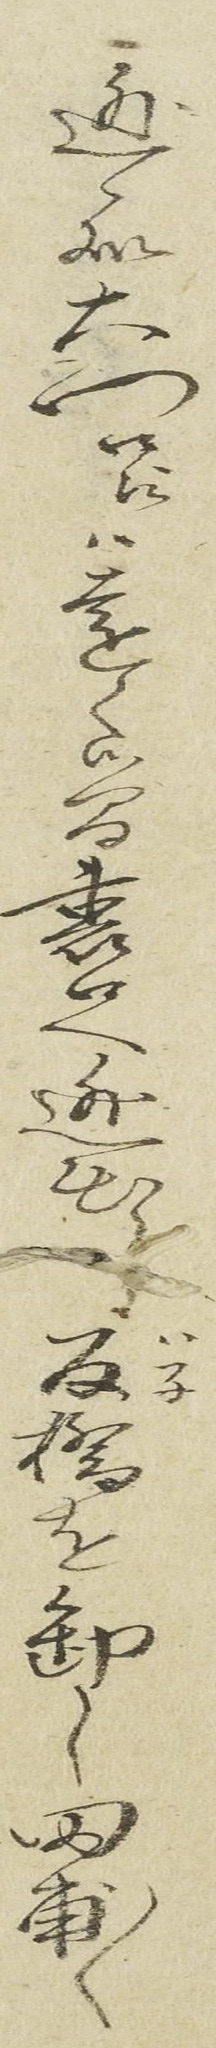逃候処大門口えハ遠く候間裏口へ逃出し反橋を卸し田甫へ
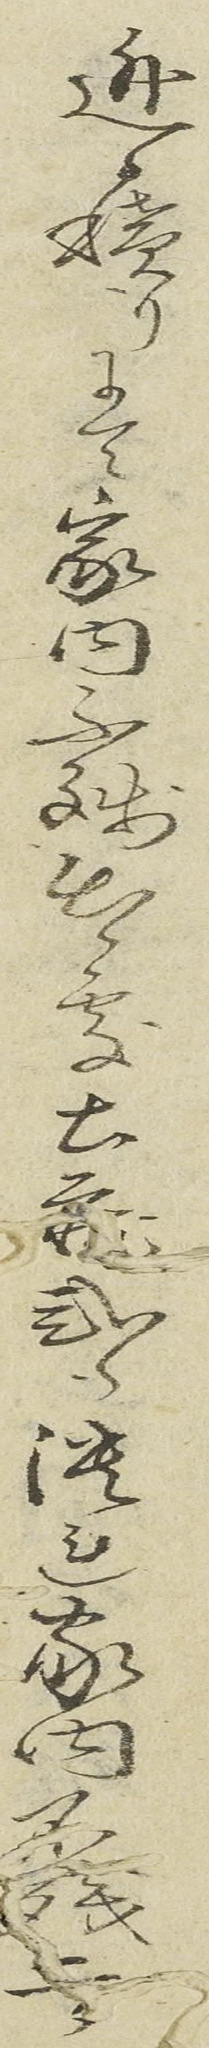逃候積りにて家内不残出候処土蔵弐ツ潰れ家内不残出

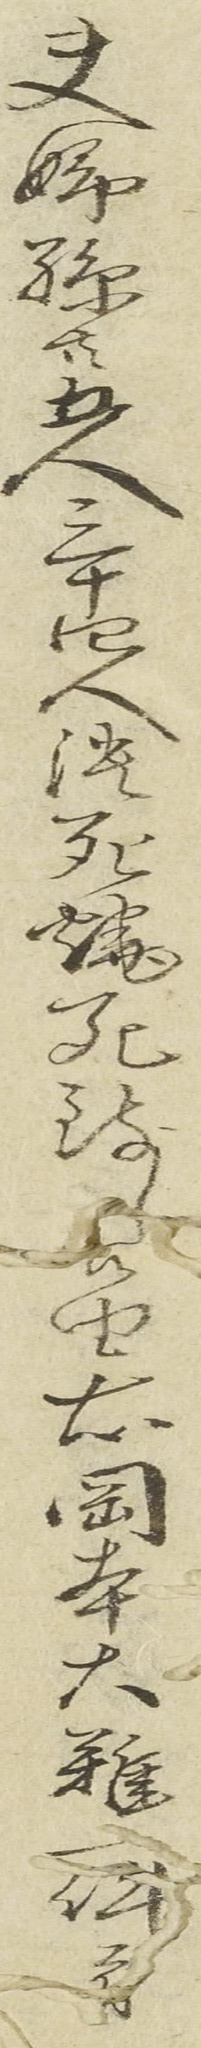夫婦孫共五人三十四人潰死焼死致し候由右岡本大難一件ニ付
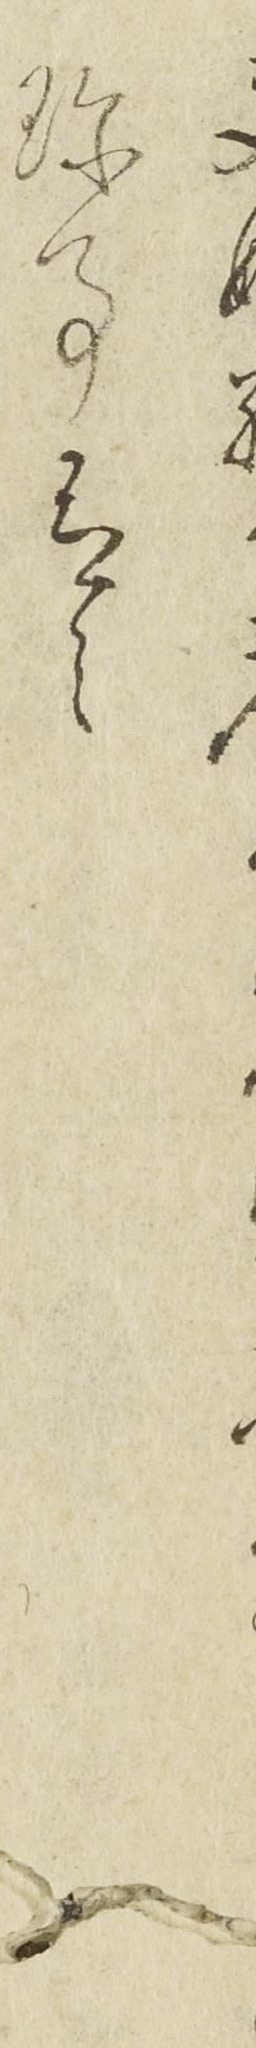珍事有之
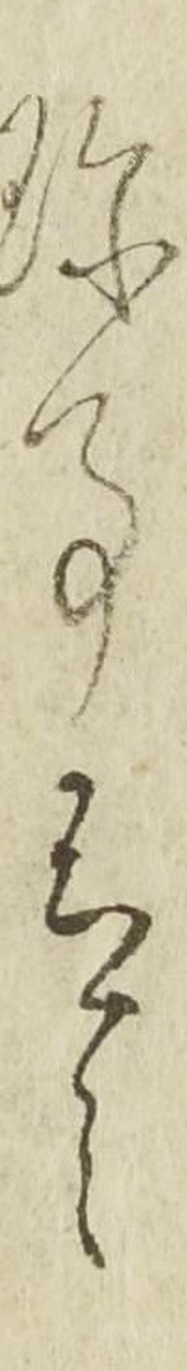珍事有之
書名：安政二乙卯年十月二日大地震之事
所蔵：東京大学地震研究所図書室 Earthquake Research Institute Library, The University of Tokyo, JAPAN
